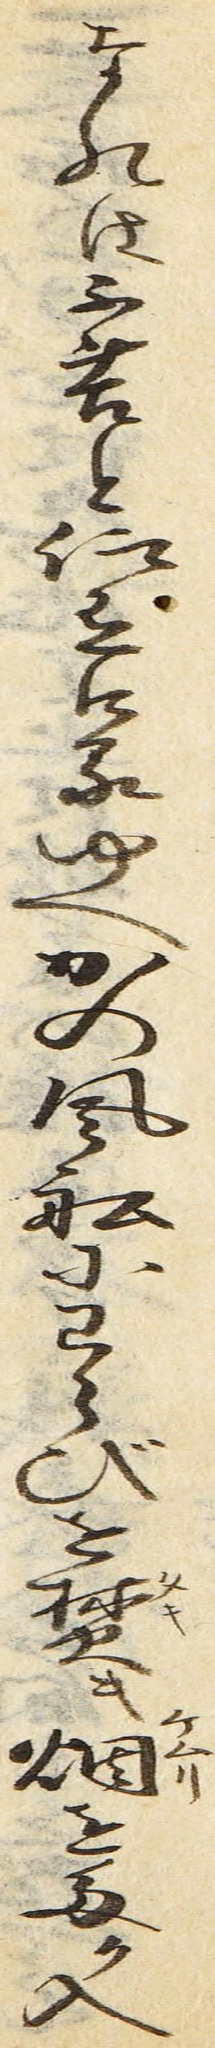なれは不苦と仰有けるゆへかの風船にわらびを焚き烟を多く入
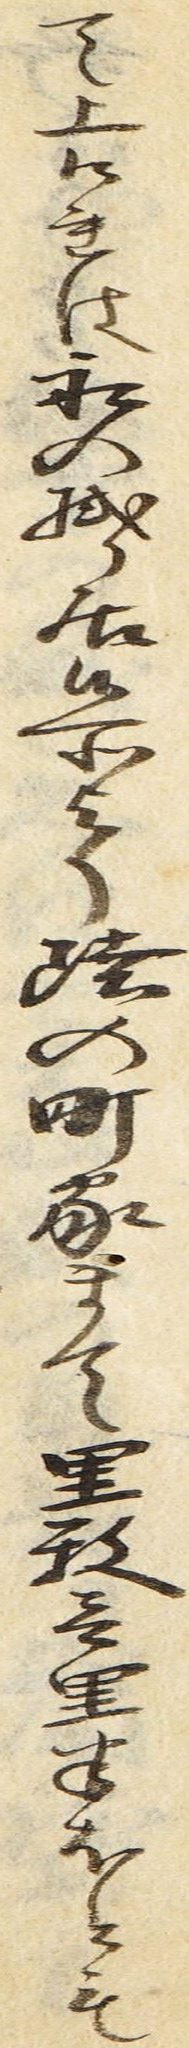て上けれは船の掛り居候所より陸の町家まて里数壱里半ほとも
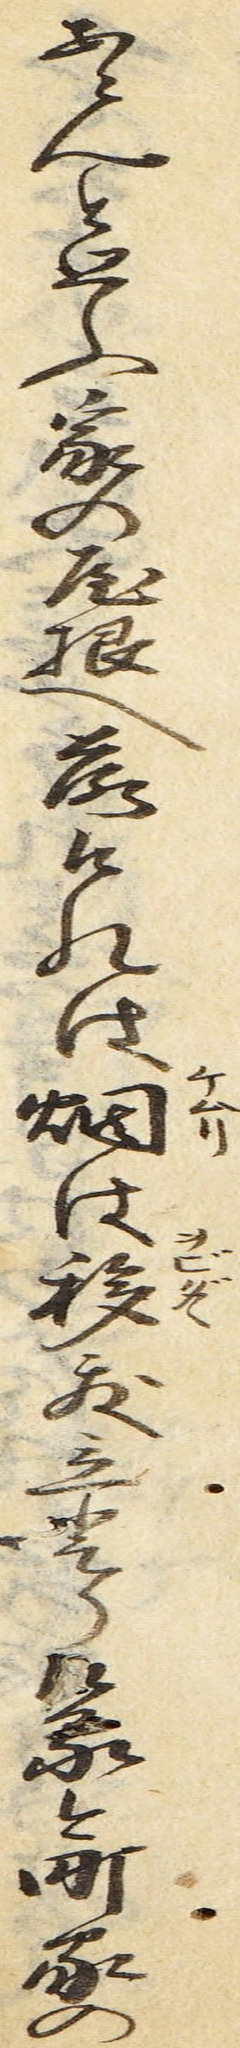あらんと思ふ家の屋根へ落けれは烟は夥敷立登りけると町家の

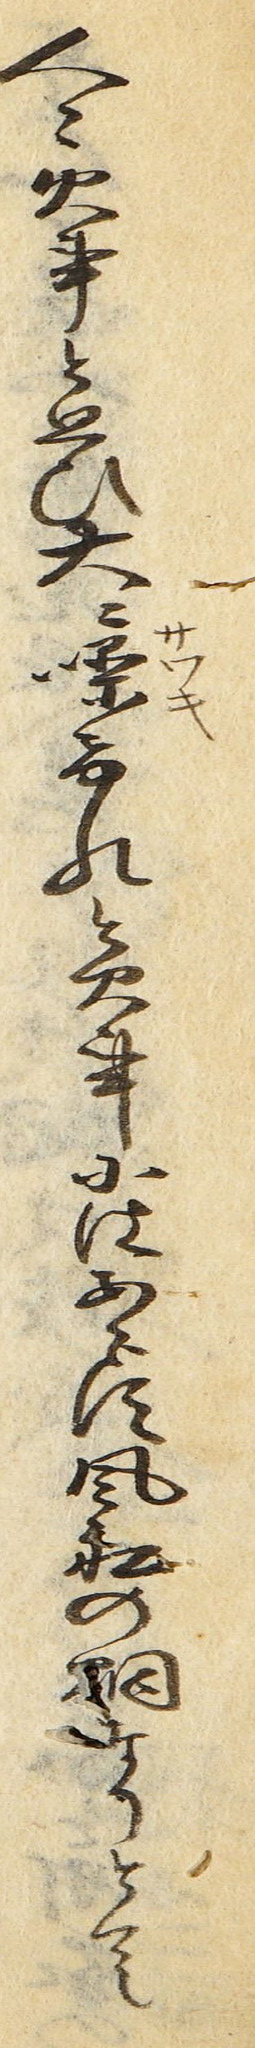人々火事と思ひ大に噪けれと火事にはあらす風船の烟なりとて
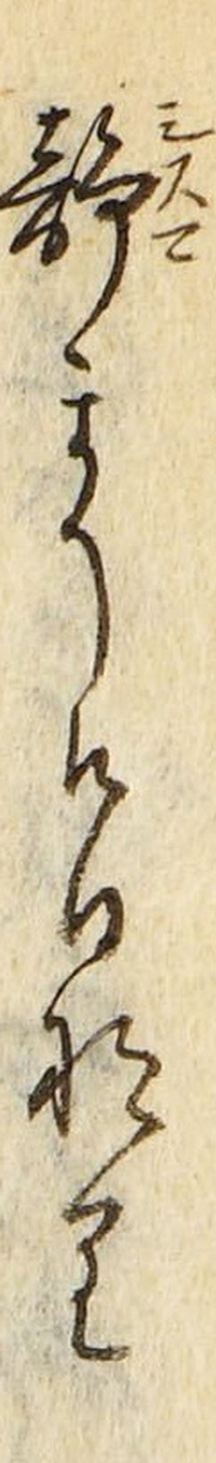静まりけるなり
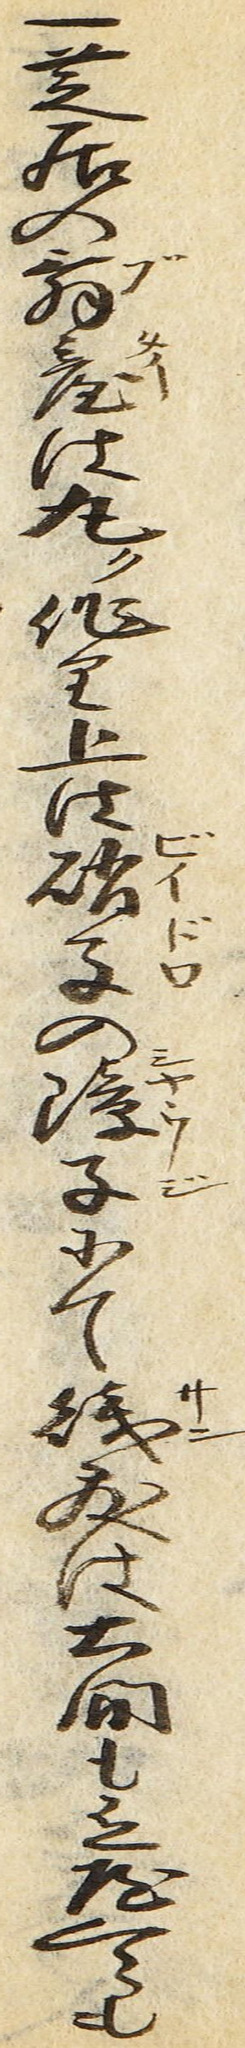一芝居の舞台は丸く作り上は硝子の障子にて賎敷は土間も有やくらも
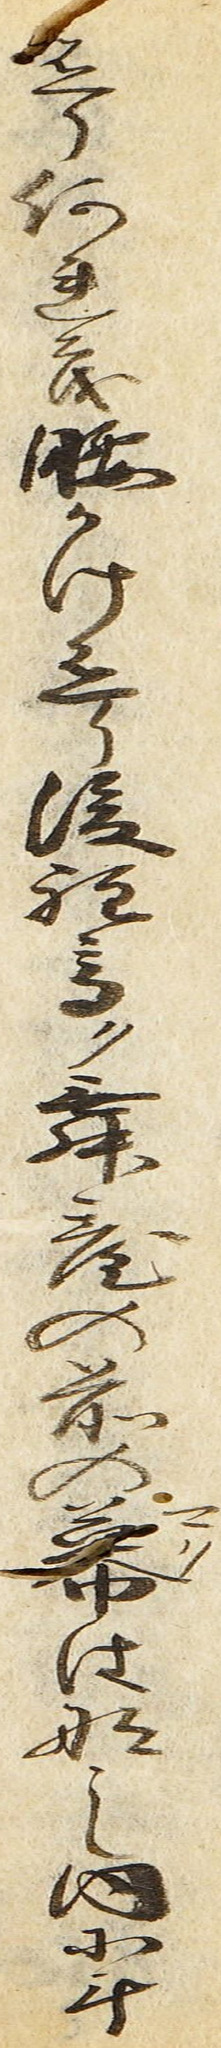有り何れも腰かけ有り後程高く舞台の前の幕はなし内に計
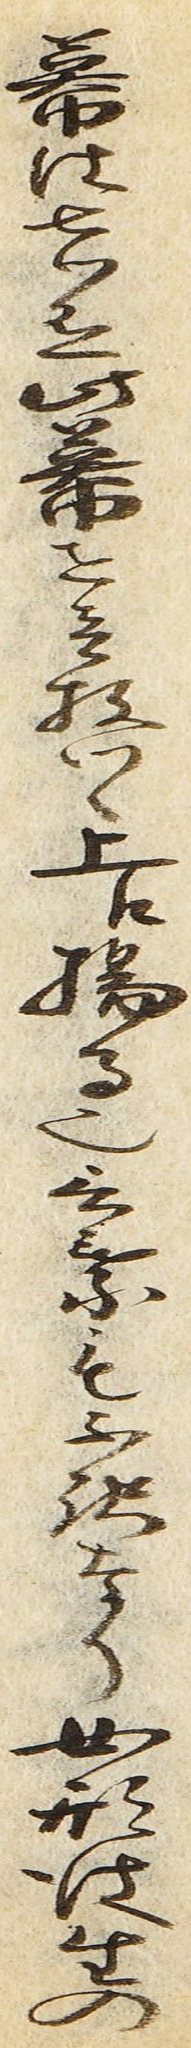幕は七つ有此幕を壱枚つゝ上え揚る也言葉も不訳なり女形は生の
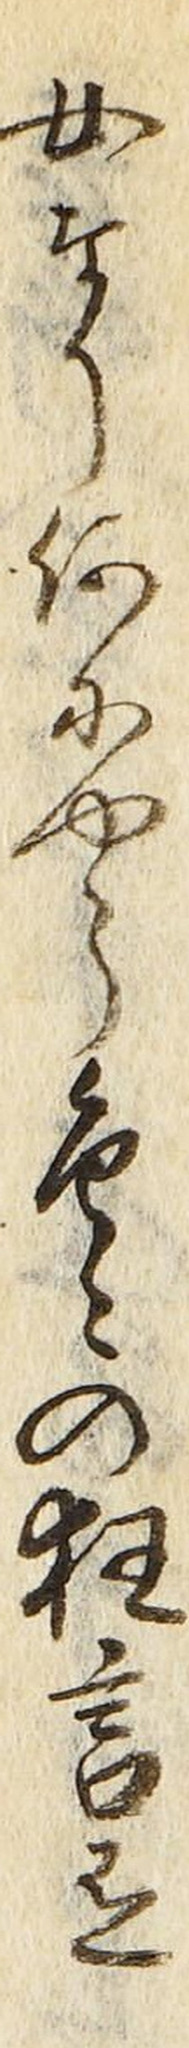女なり何にやらい色々の狂言有
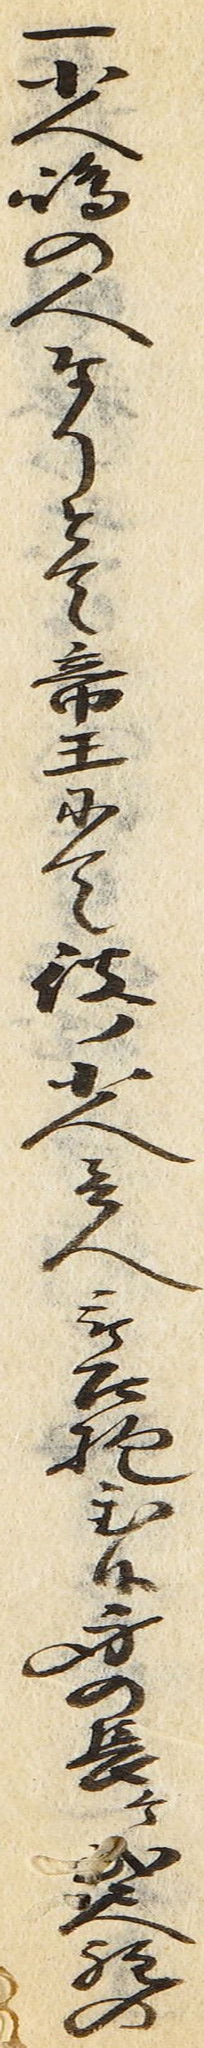一小人嶋の人なりとて帝王にて彼ノ小人壱人被召抱置候身の長ヶ弐尺程の
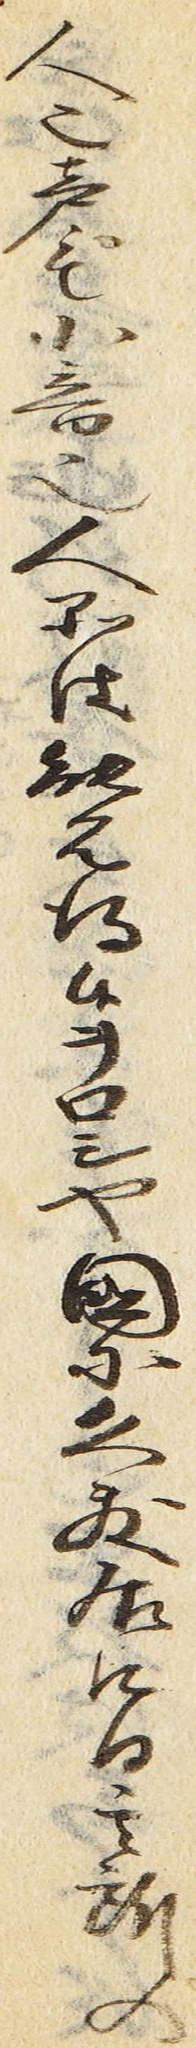人也声も小音也人品は能見得候ヲロシア国に久敷居ける其所の
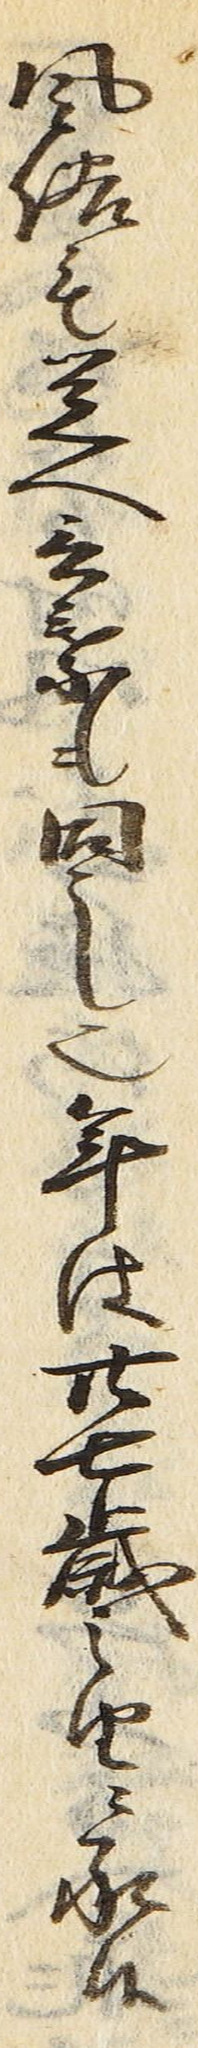風俗も覚へ言葉も同し也年は廿七歳之由に承候
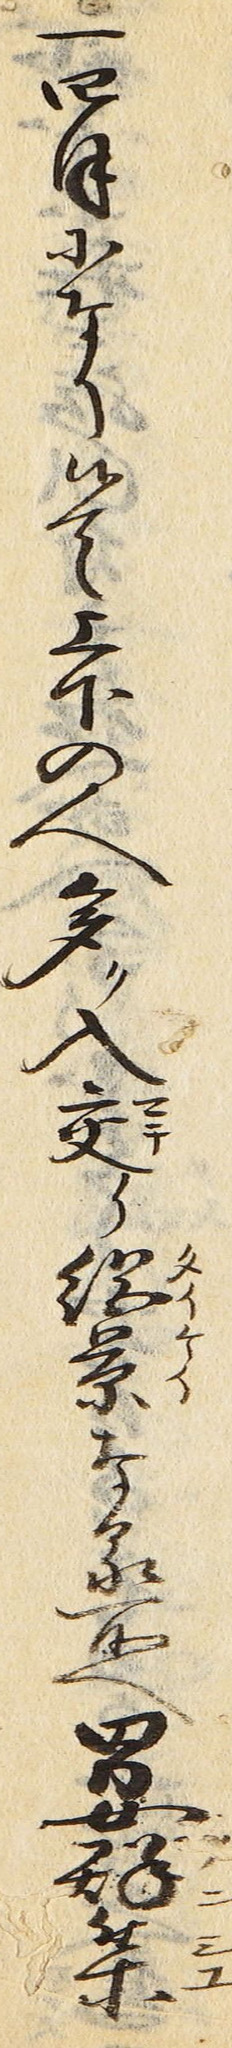一四月になり候て上下の人多く入交り絶景なる所へ男女群集
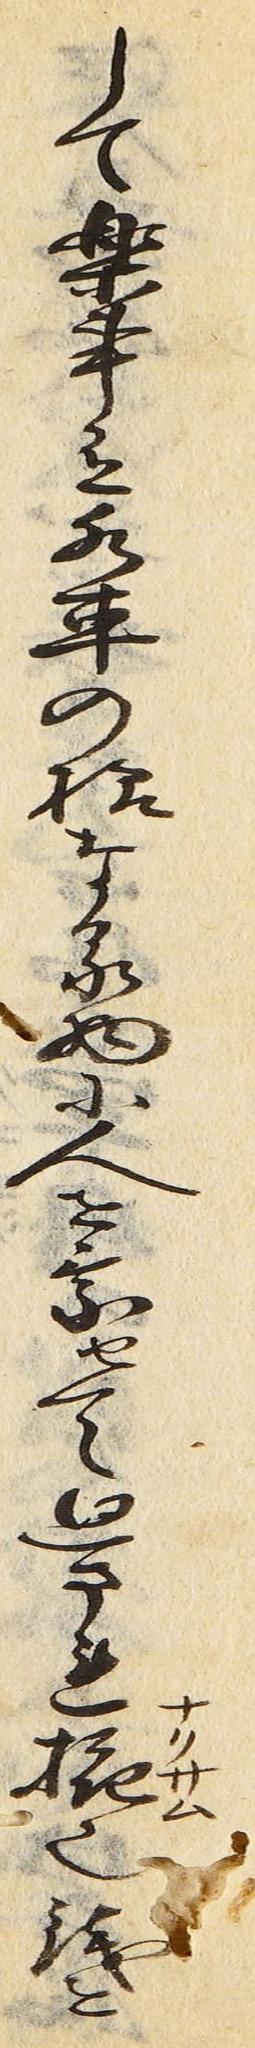して楽事有水車の様なる物に人を乗せて廻され椛也銭を
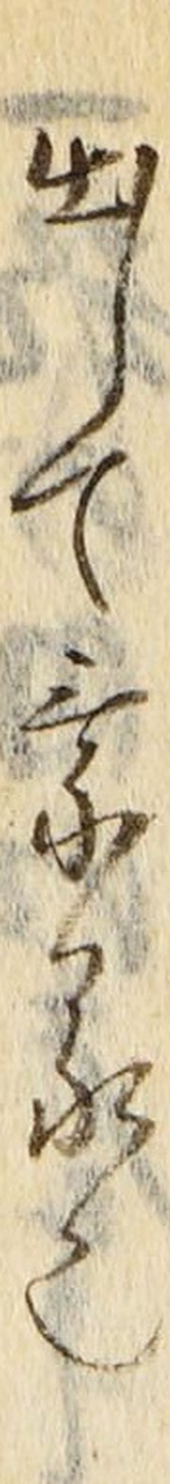出して乗る也
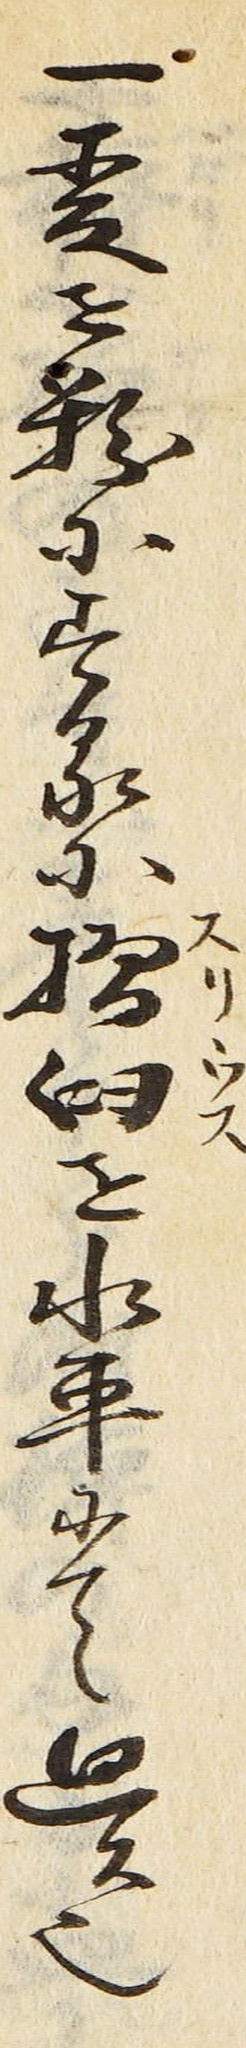一麦を粉にするに摺臼を水車にて廻す也
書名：外国漂流記
